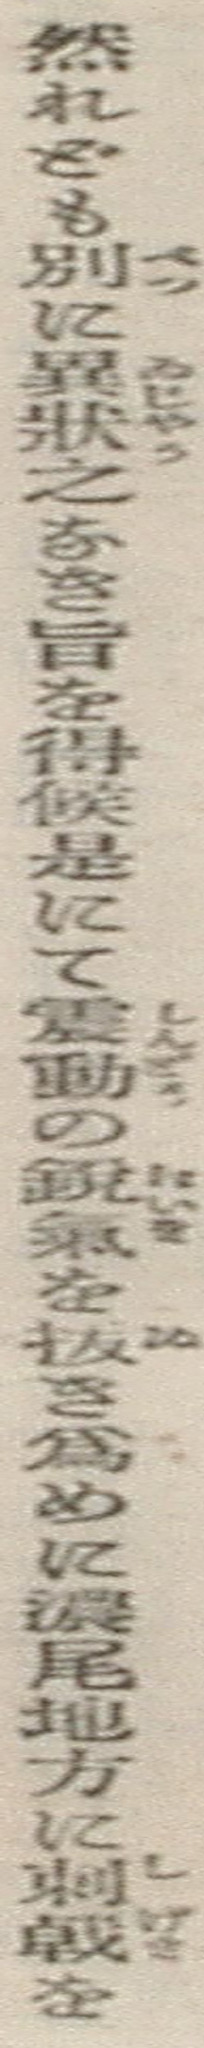然れども別に異状之なき旨を得候是にて震動の鋭気を抜き為めに濃尾地方に刺激を
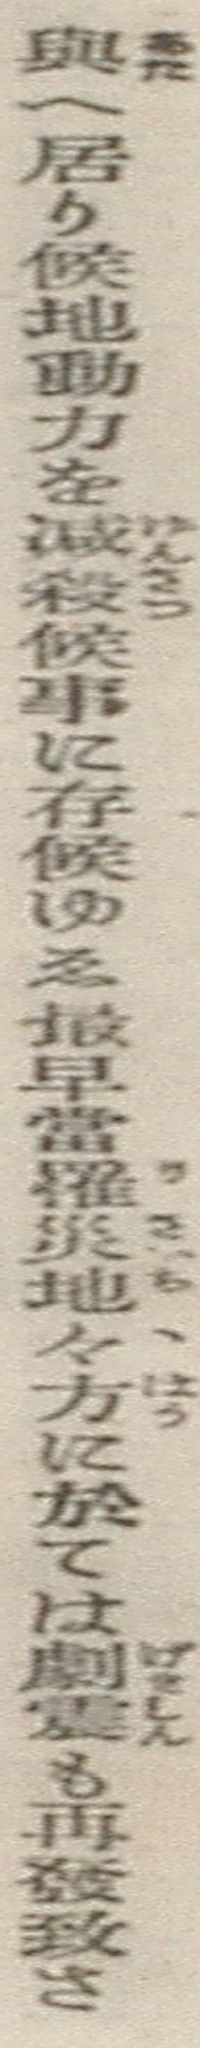與へ居り候地動力を減殺候事に存候ゆゑ最早當罹災地々方に於ては激震も再発致さ
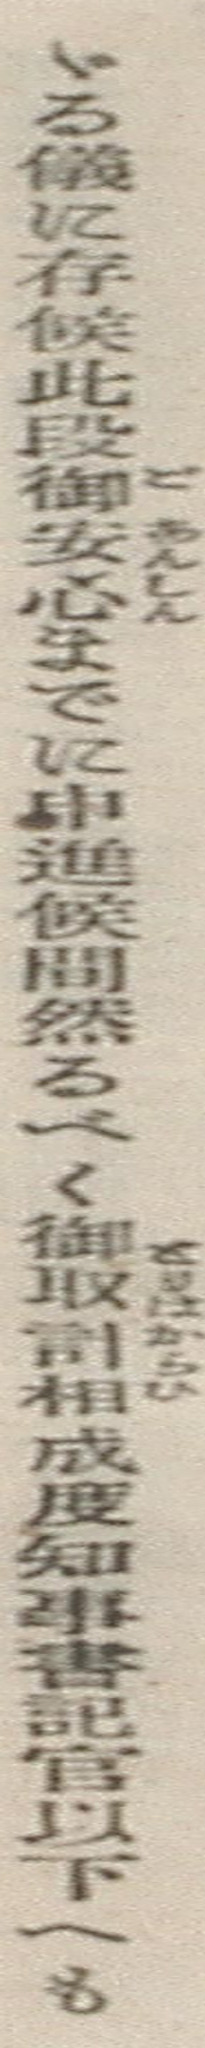ゞる儀に存候此段御安心までに申進候間然るべく御取計相成度知事書記官以下へも
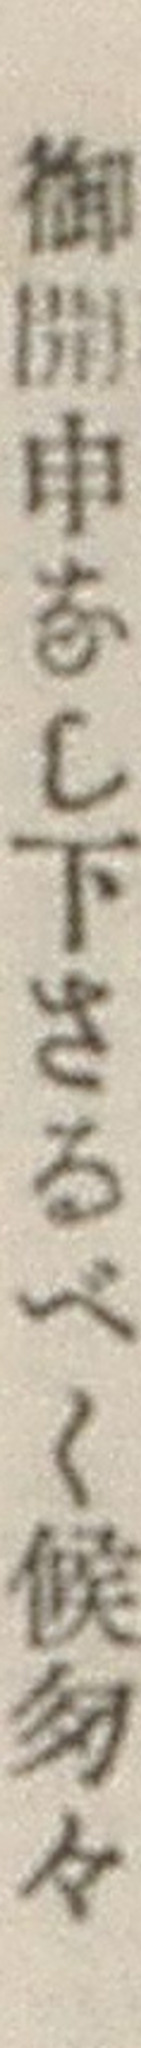御開申なし下さるべく候匇々
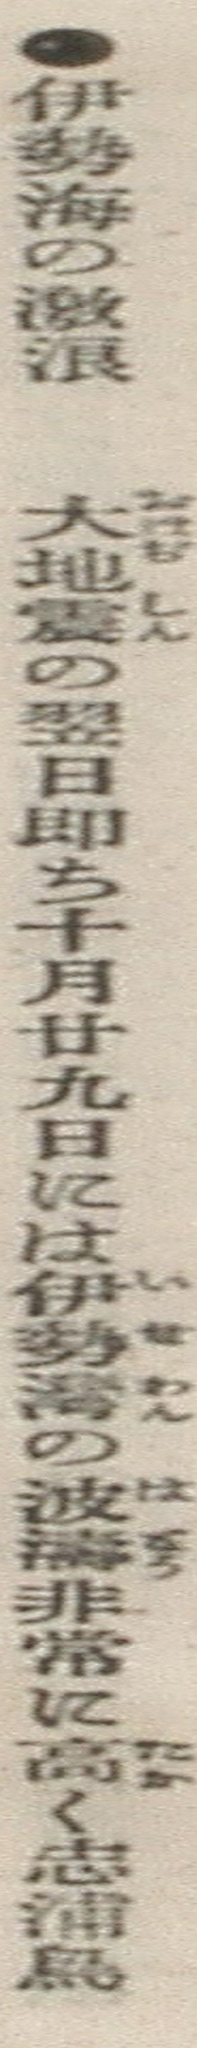●伊勢海の激浪大地震の翌日即ち十月廿九日には伊勢湾の波濤非常に高く志浦鳥
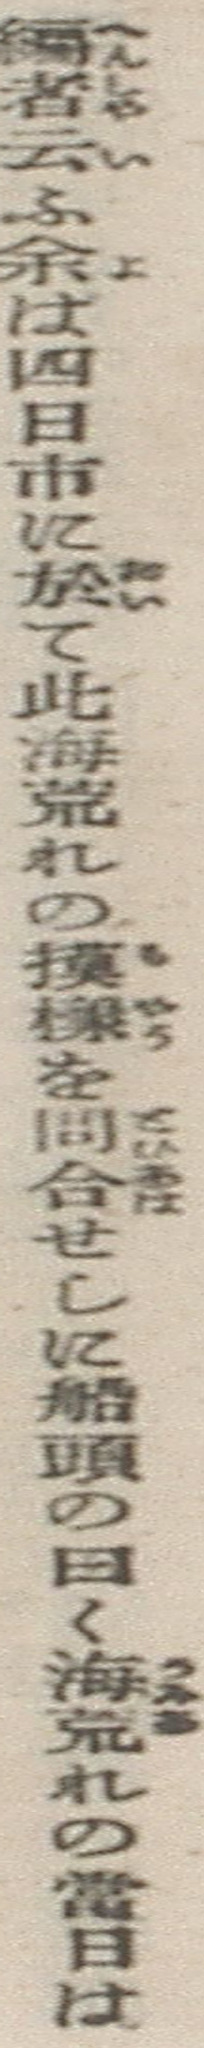編者云ふ余は四日市に於て此海荒れの模様を問合せしに船頭の曰く海荒れの当日は
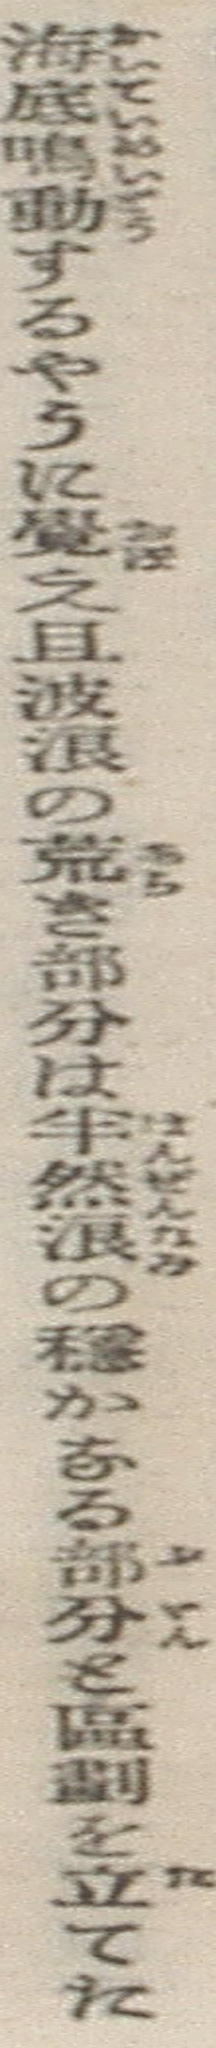海底鳴動するやうに覚え且波浪の荒き部分は半然浪の穏かなる部分と區割を立てた
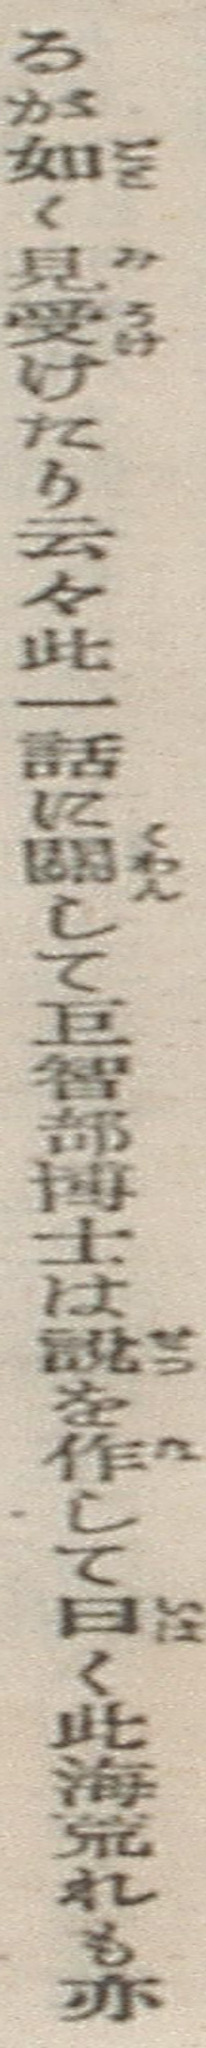るが如く見受けたり云々此一話に関して巨智部博士は説を作して曰く此海荒れも亦
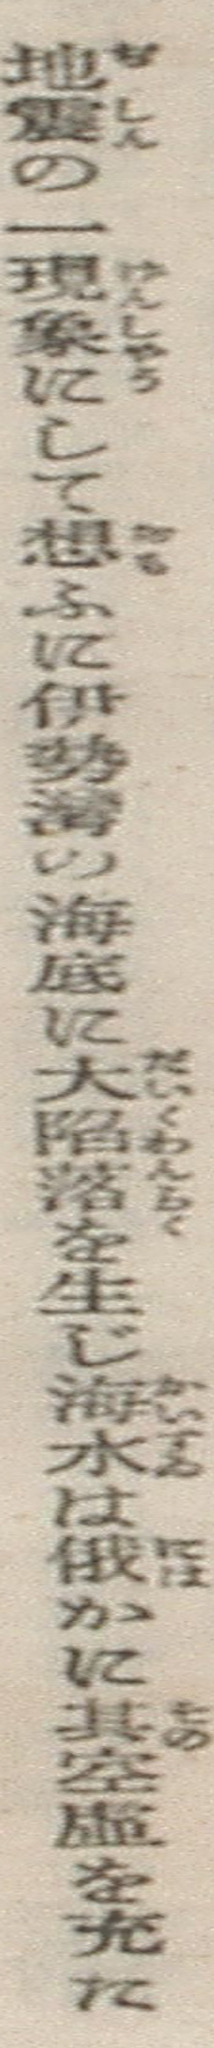地震の一現象にして想ふに伊勢湾の海底に大陥落を生じ海水は俄かに其空虚を充た
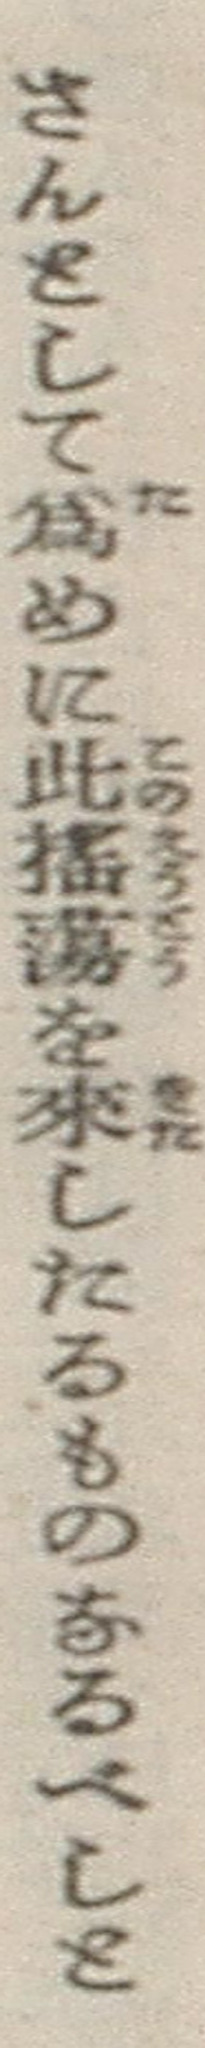さんとして為めに此揺蕩を来したるものなるべしと
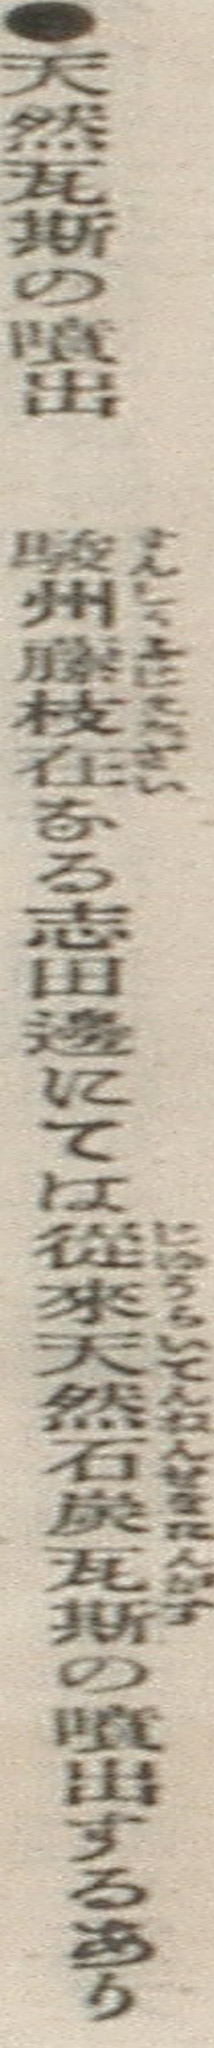●天然瓦斯の噴出駿州藤枝在なる志田邊にては従来天然石炭瓦斯の噴出するあり
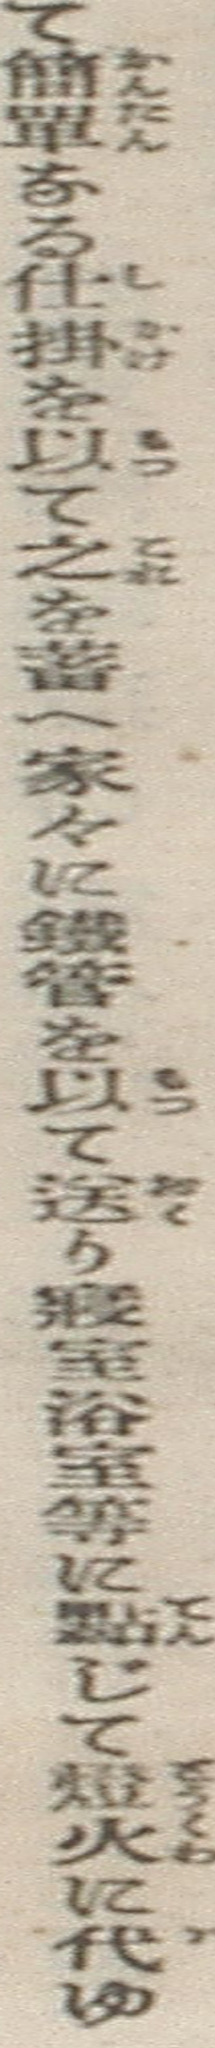て簡単なる仕掛を以て之を蓄へ家々に鐡管を以て送り寝室浴室等に点じて燈火に代ゆ
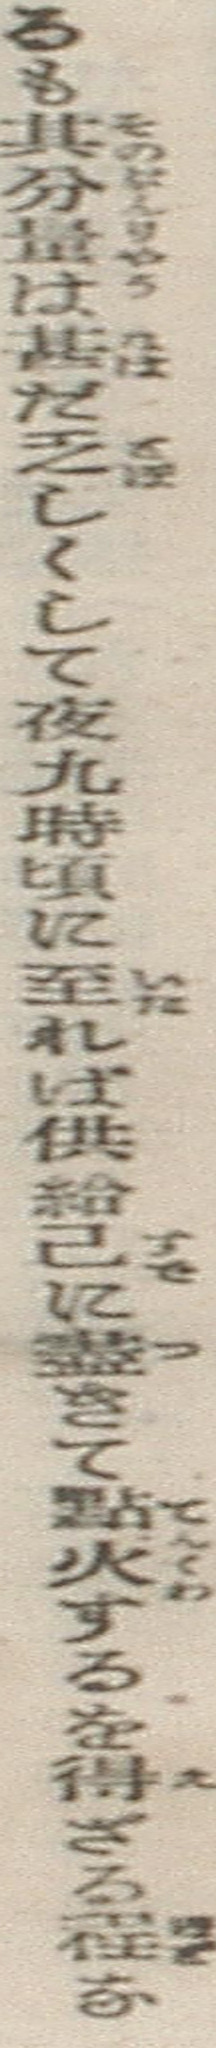るも其分量は甚だ乏しくして夜九時頃に至れば供給已に盡きて点火するを得ざる程な
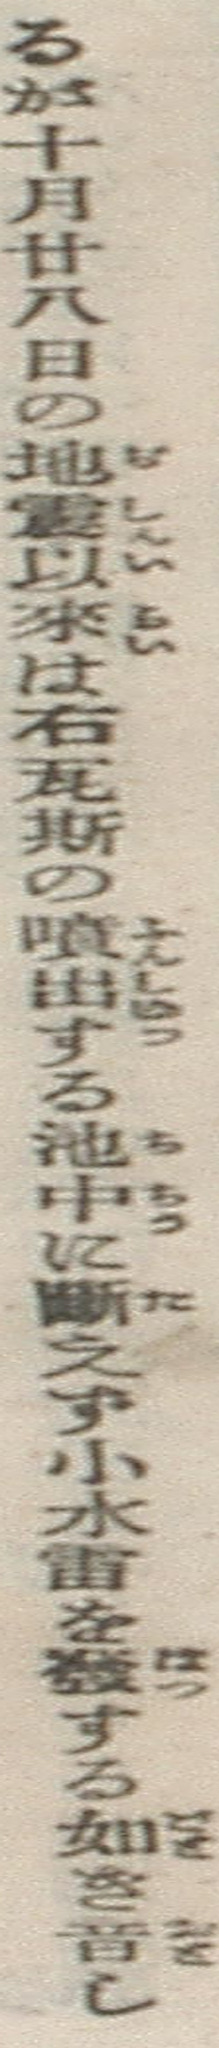るが十月廿八日の地震以来は右瓦斯の噴出する池中に断えず小水雷を発する如き音し
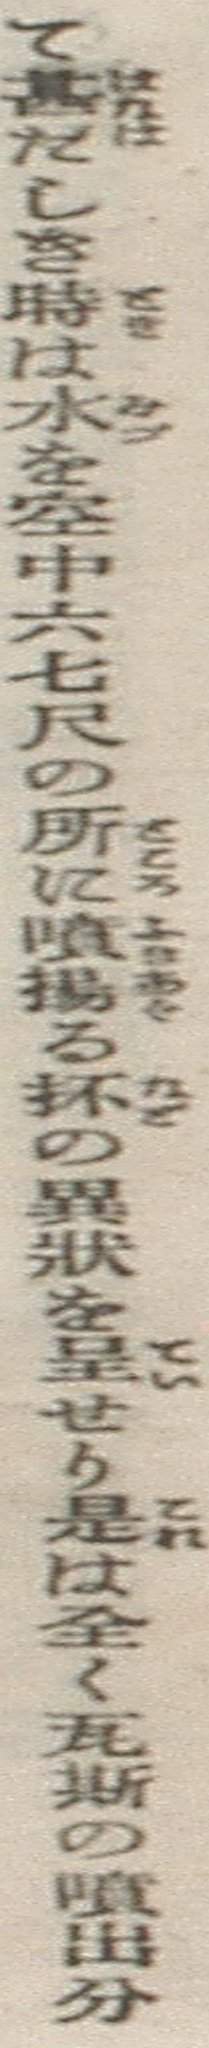て甚だしき時は水を空中六七尺の所に噴揚る抔の異状を呈せり是は全く瓦斯の噴出分
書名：愛知岐阜福井三県　大地震見聞録（内題）
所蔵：東京大学地震研究所図書室 Earthquake Research Institute Library, The University of Tokyo, JAPAN
